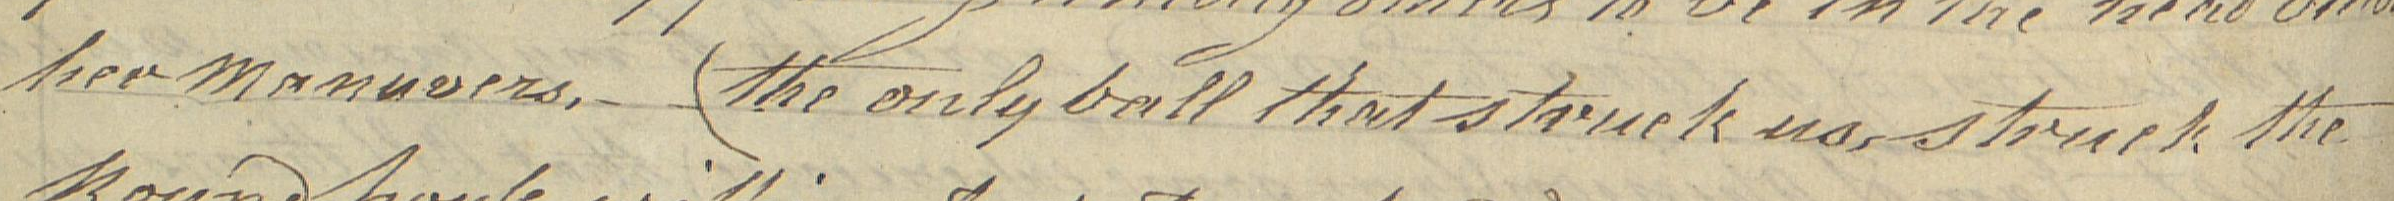her manuvers. (the only ball that struck us, struck the
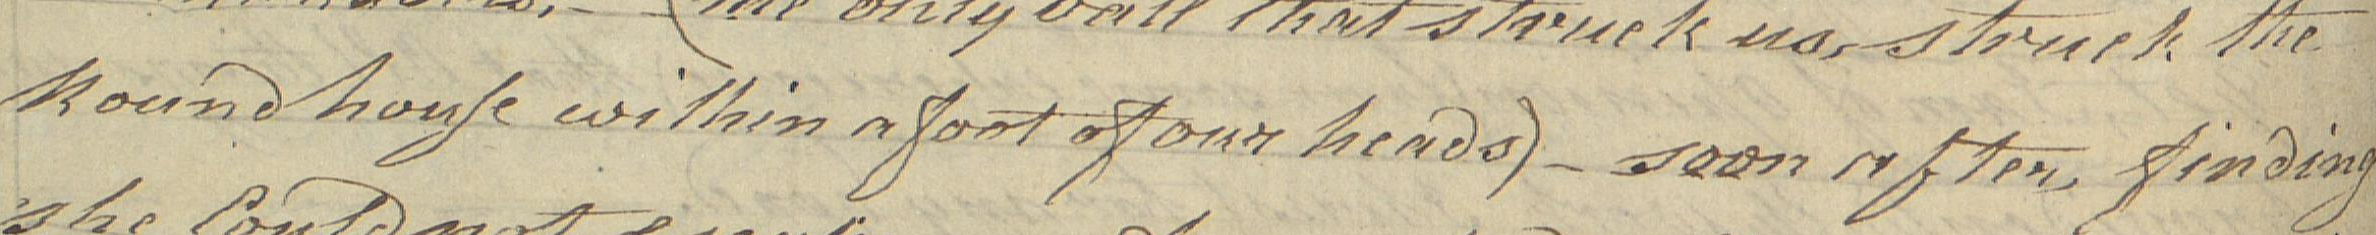Round house within afoot of our heads) soon after finding
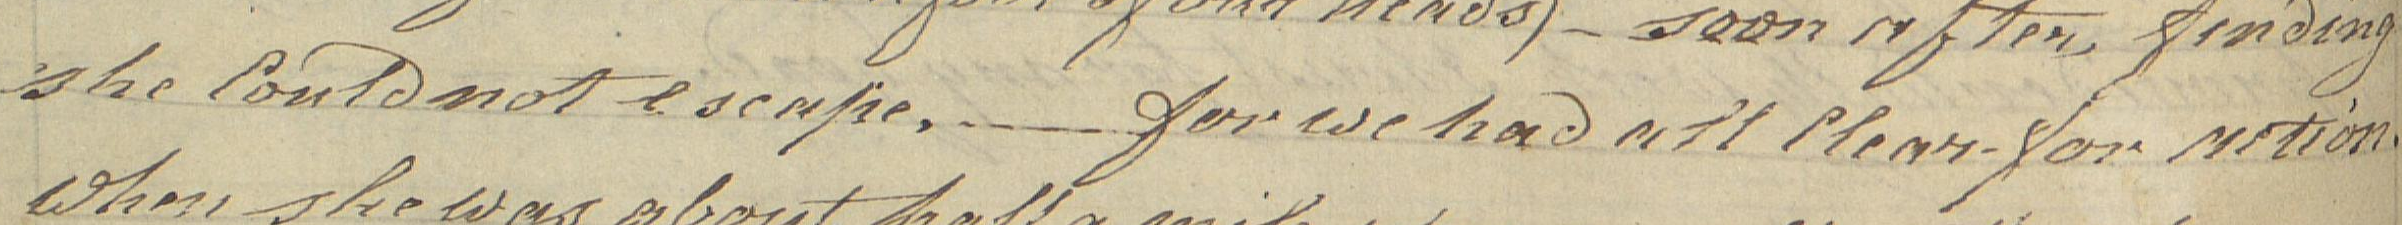she Could not Escape. for we had all Clear for action.
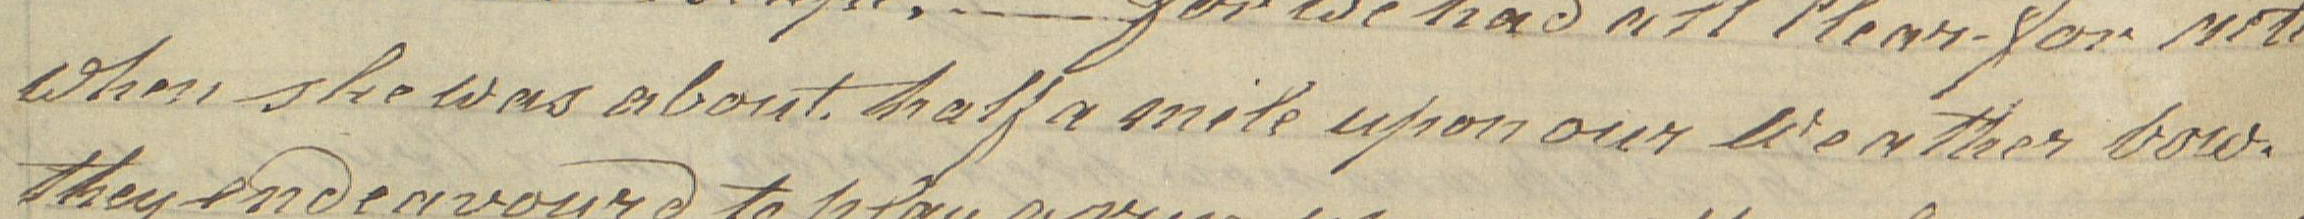when she was about half a mile upon our Weather bow.
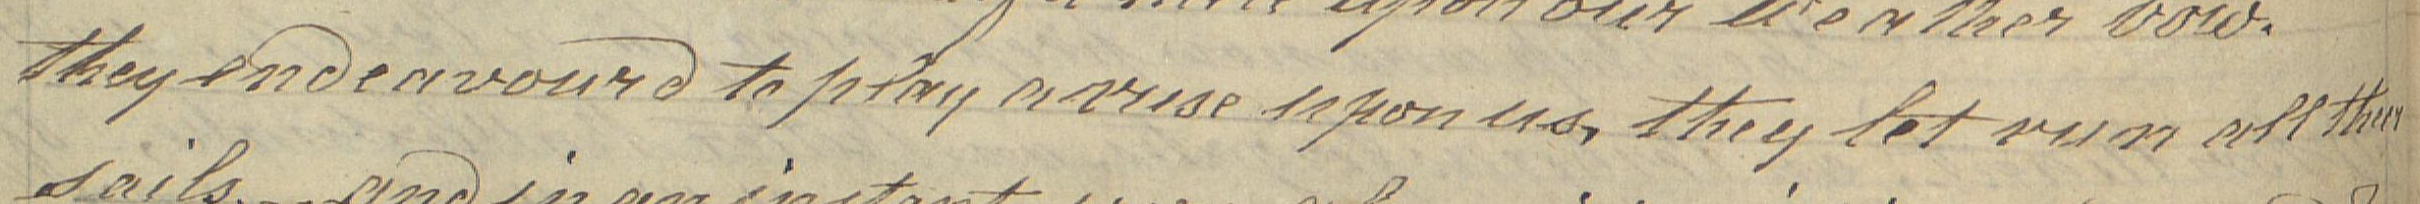they endeavourd to play a ruse upon us, they let run all the-
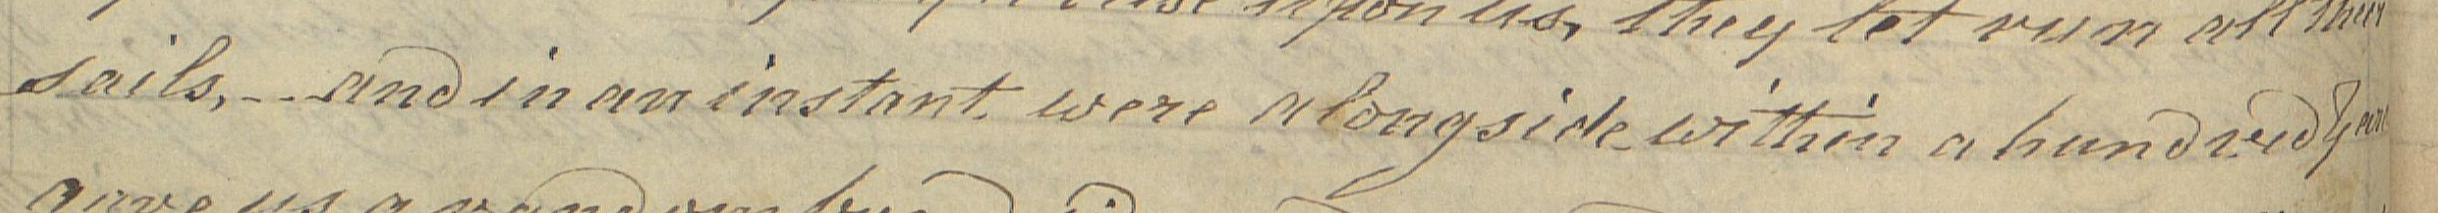sails, and in an instant were alongside within a hundred yea-
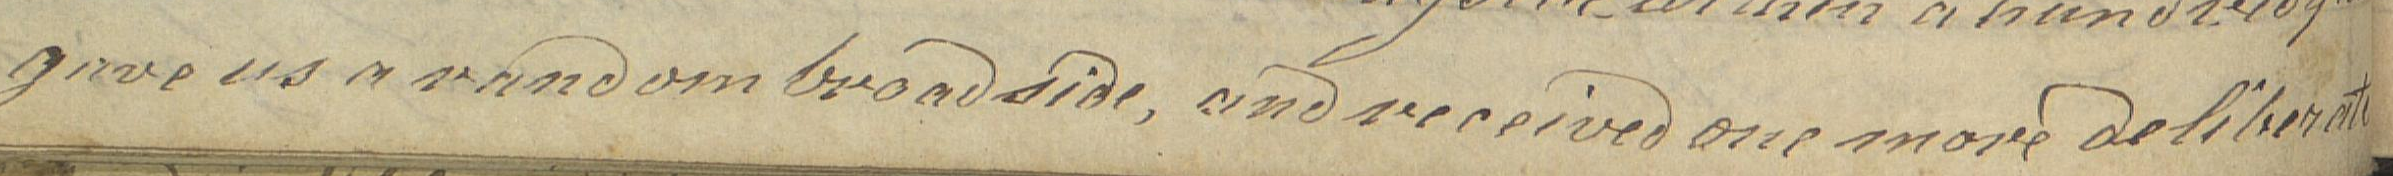give usa random broadside, and received one more deliberate
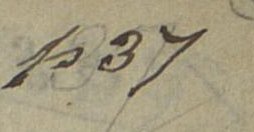p 37
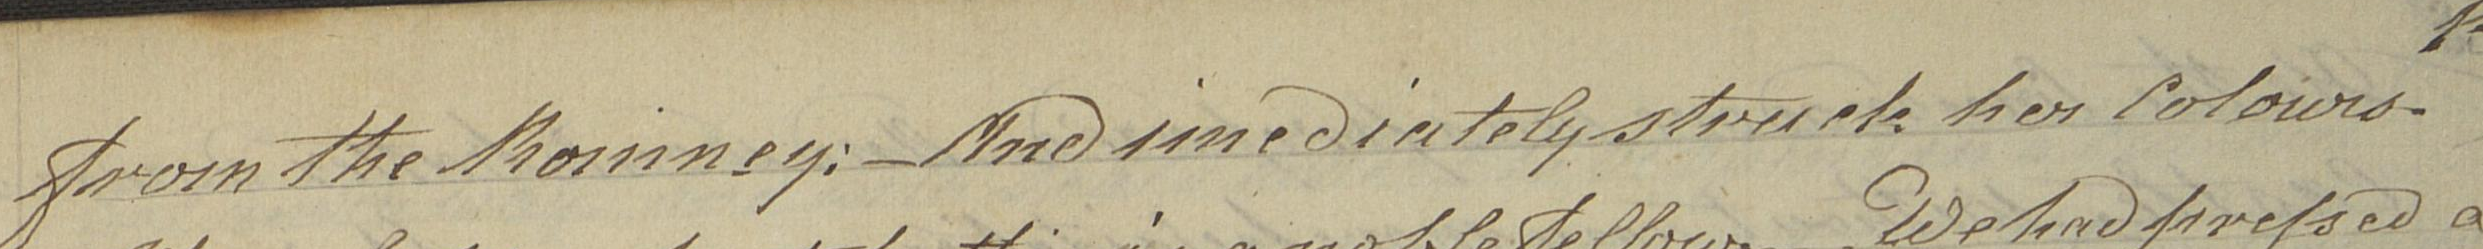from the Romney; And imediately struck her Colours.
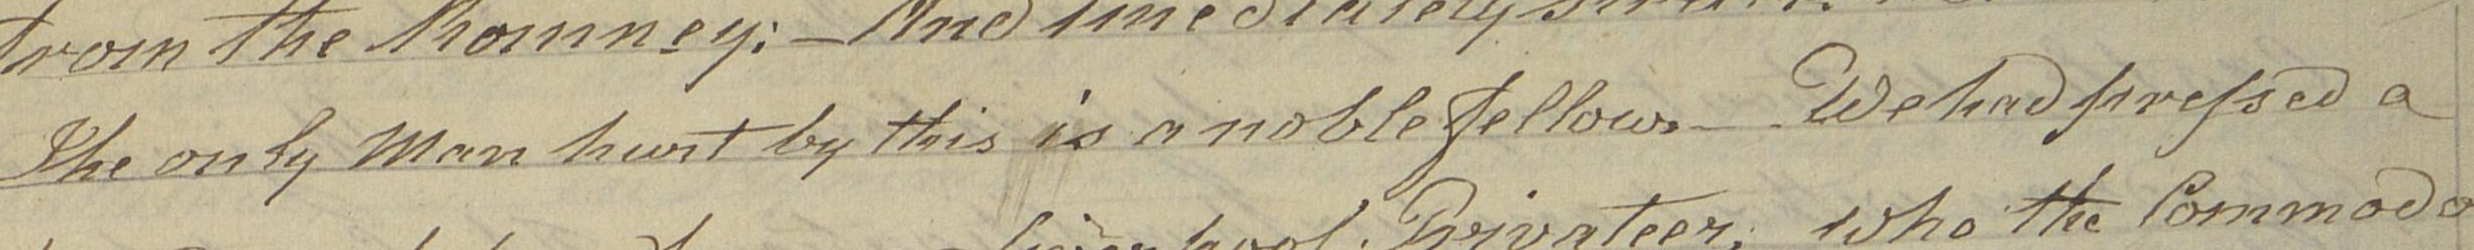The only Man hurt by this is a noble fellow. We had pressed a
